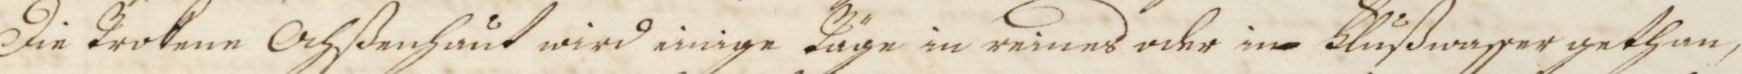Die Trokene Ochßenhaut wird einige Täge in reines oder in Flußwasser gethan,
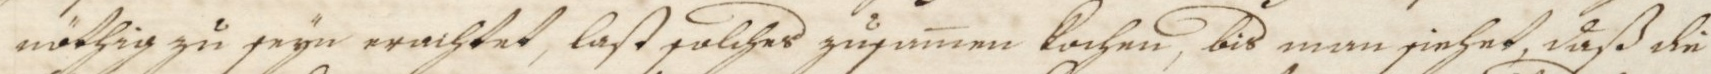nöthig zu seyn erachtet, last solches zusammen kochen, bis man siehet, daß die
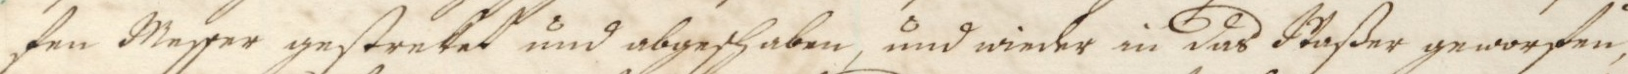fen Messer gestreket und abgeschaben, und wieder in das Waßer geworfen,
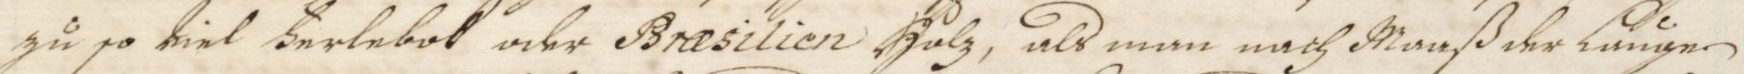zu so viel Ferlebok oder Brasilien Holz, als man nach Maaß der Lauge
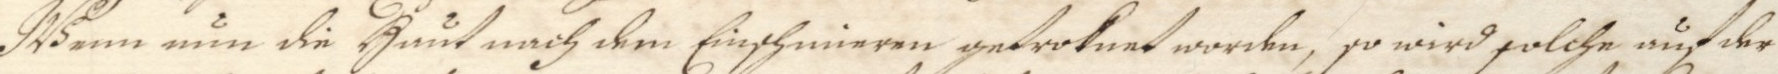Wenn nun die Haut nach dem Einschmieren getroknet worden, so wird solche auf der
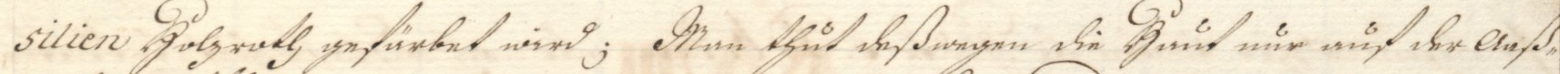silien Holzroth gefärbet wird. Man thut deßwegen die Haut nur auf der Aaß-
